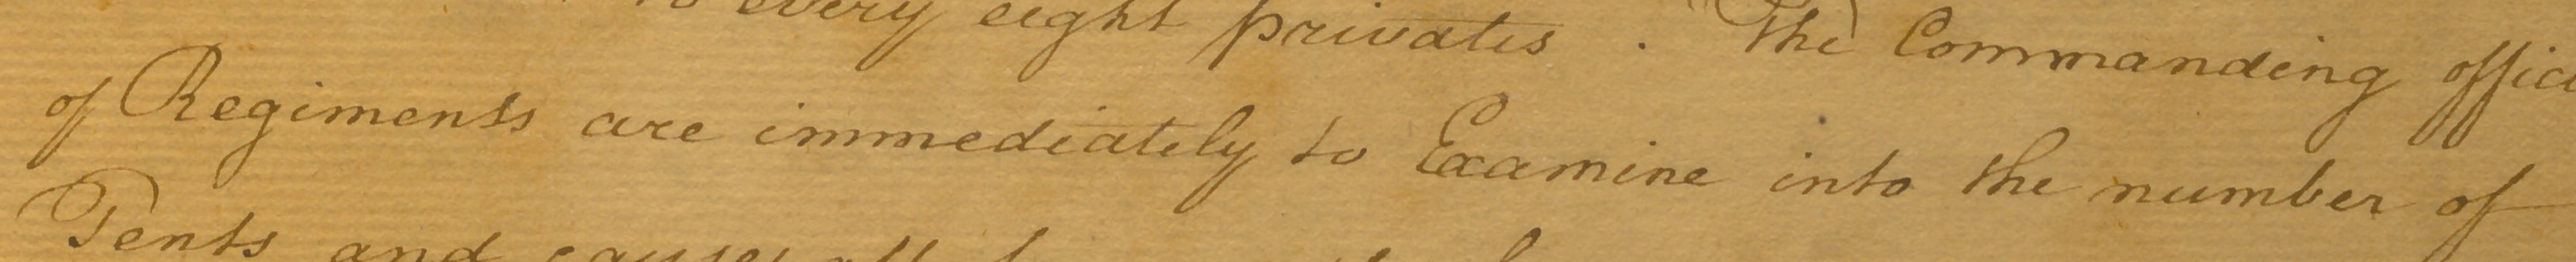of Regiments are immediately to Examine into the number of
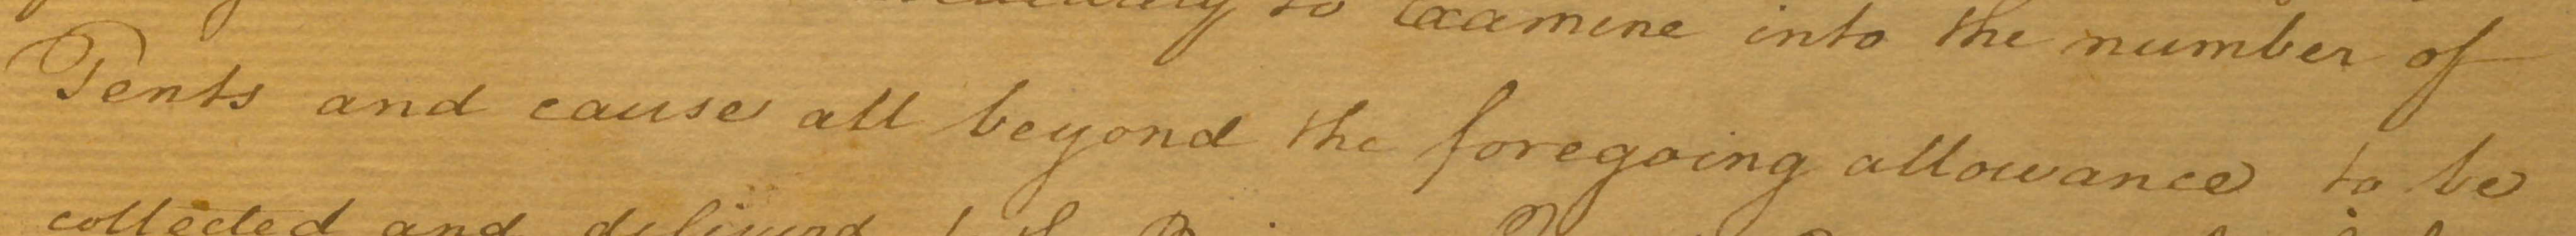Tents and cause all beyond the foregoing allowance to be
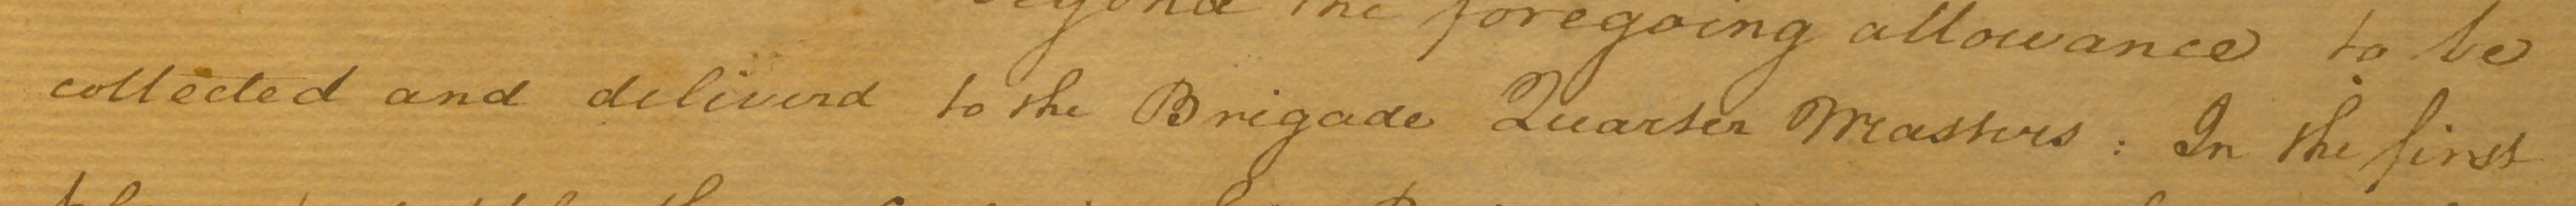collected and deliverd to the Brigade Quarter Masters. In the first
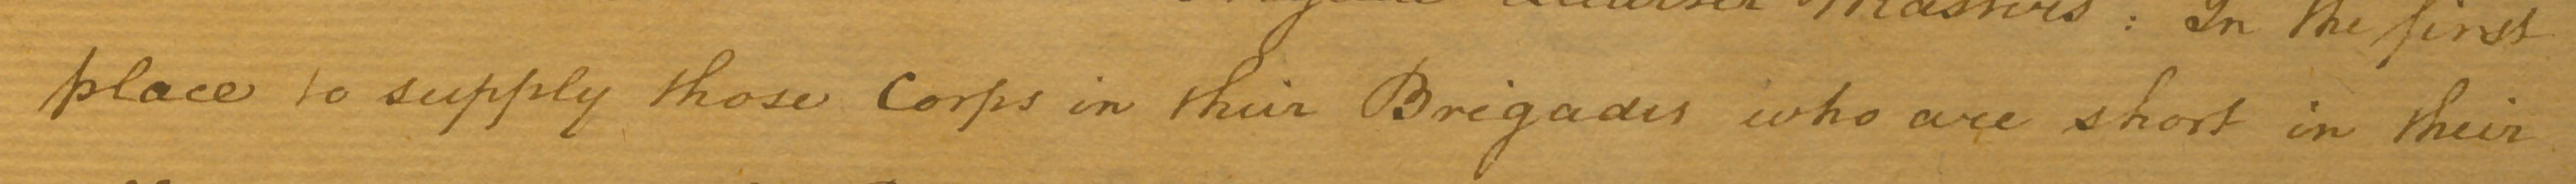place to supply those Corps in their Brigades who are short in their
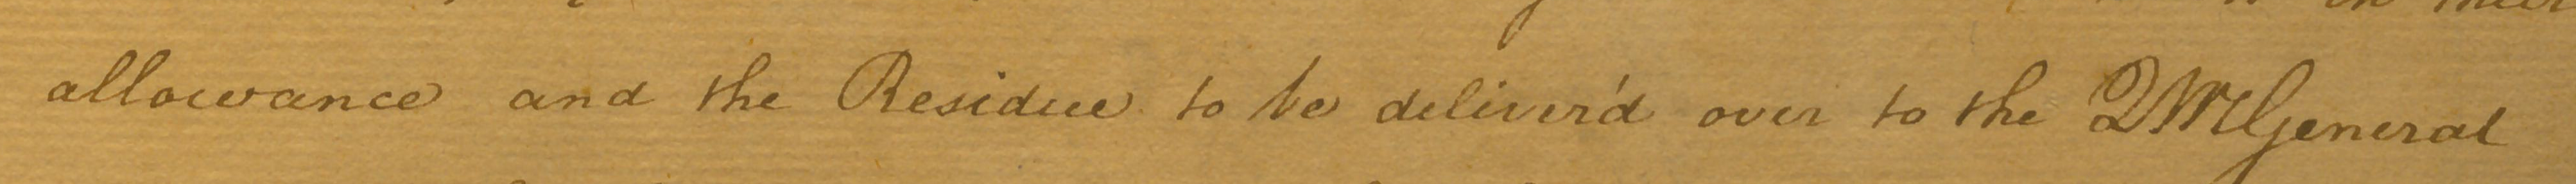allowance and the Residue to be deliver'd over to the QM General
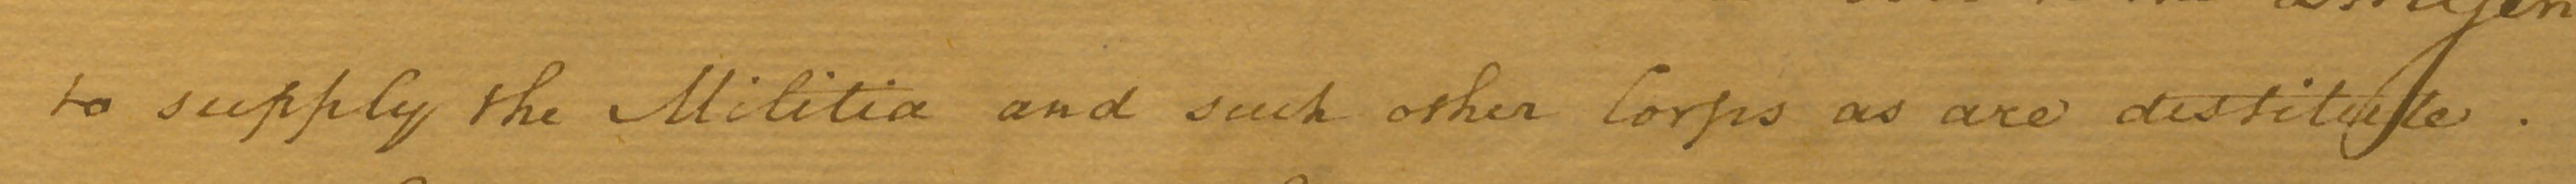to supply the Militia and such other Corps as are destitute.
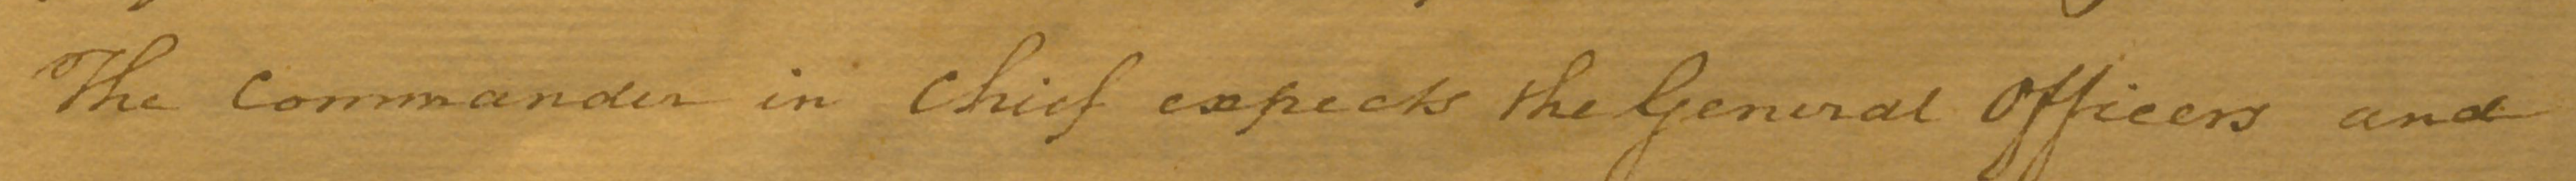The Commander in Chief expects the General Officers and
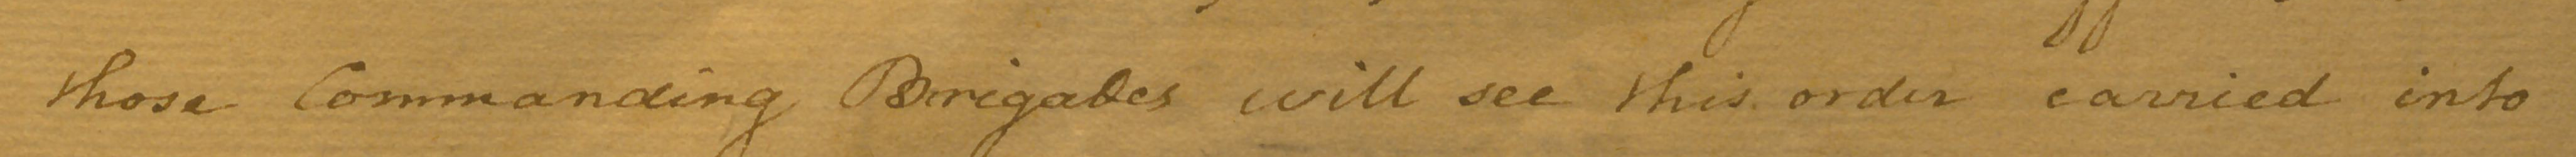those Commanding Brigades will see this order carried into
